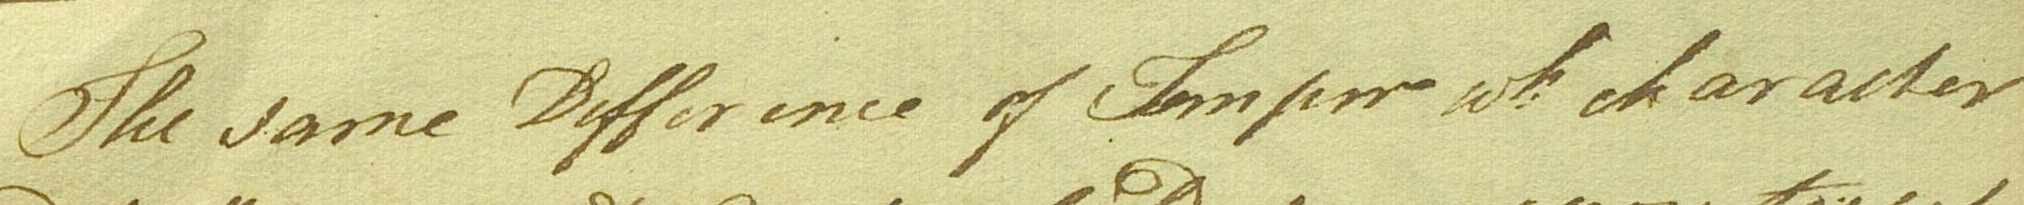The same Difference of Temper w^h character
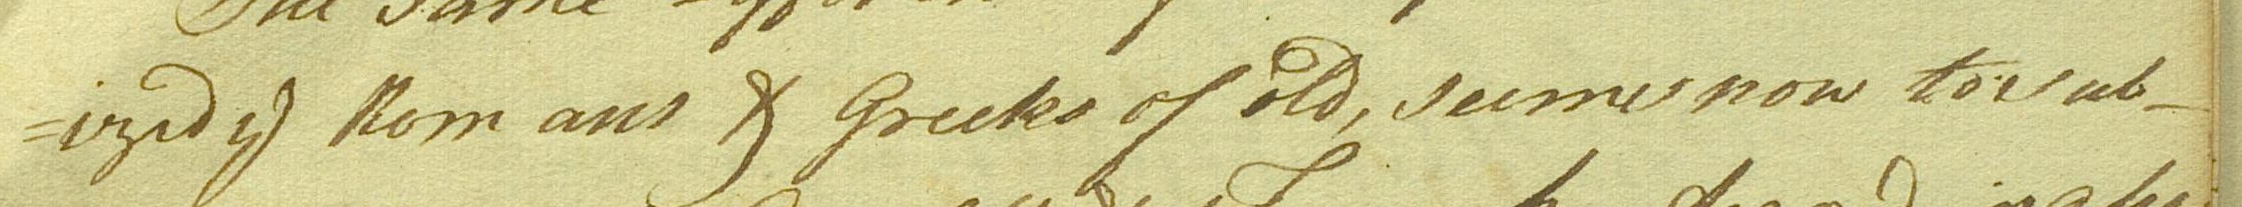-ized y^e Romans & Greeks of old, seems now to sub-
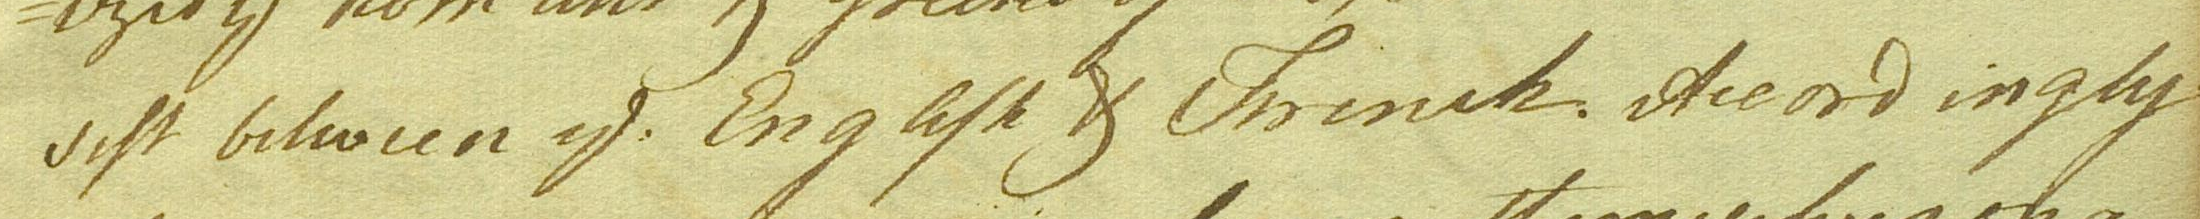sist between y^e English & French. Accordingly
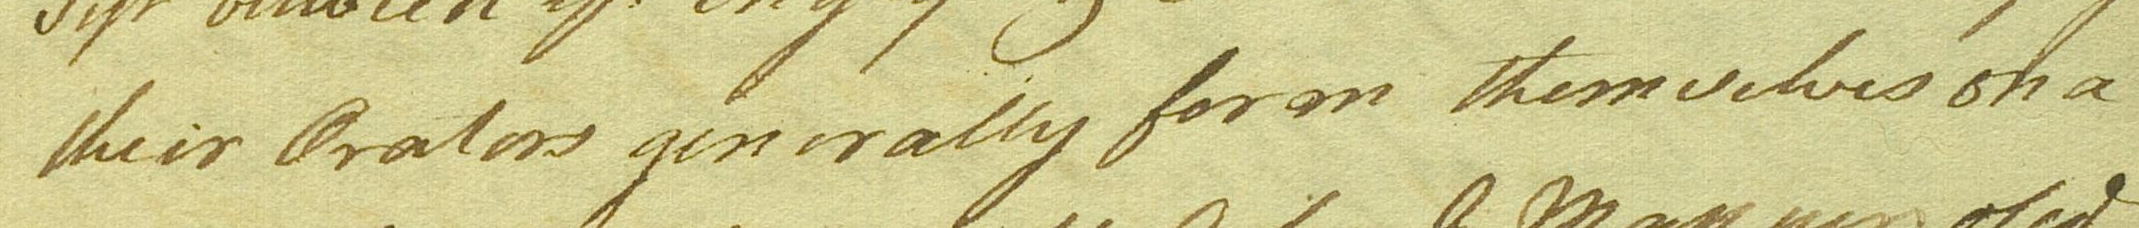their Orators generally form themselves on a
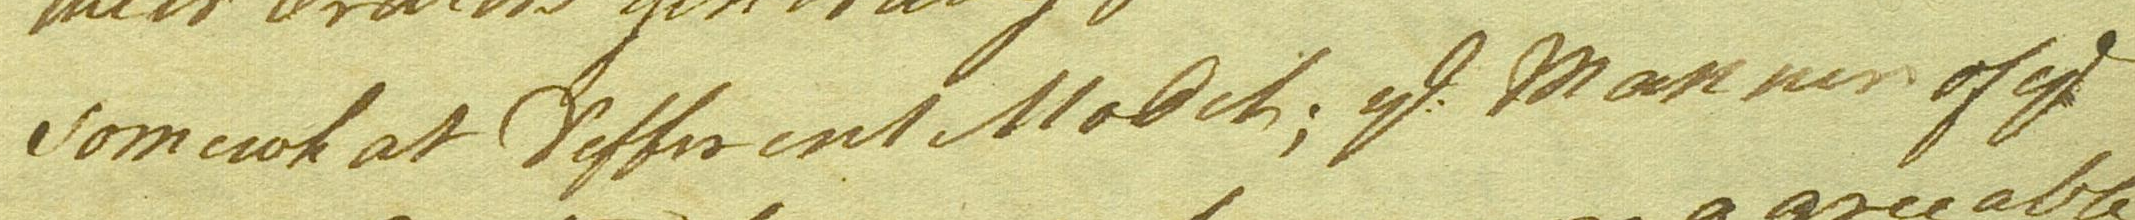somewhat Different Model; y^e: Manner of y^e
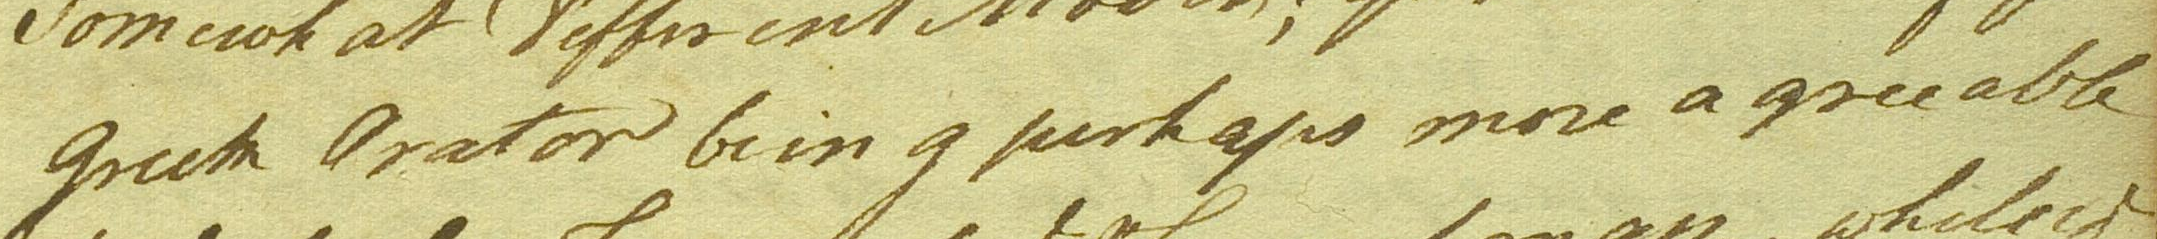Great Orator being perhaps more agreeable
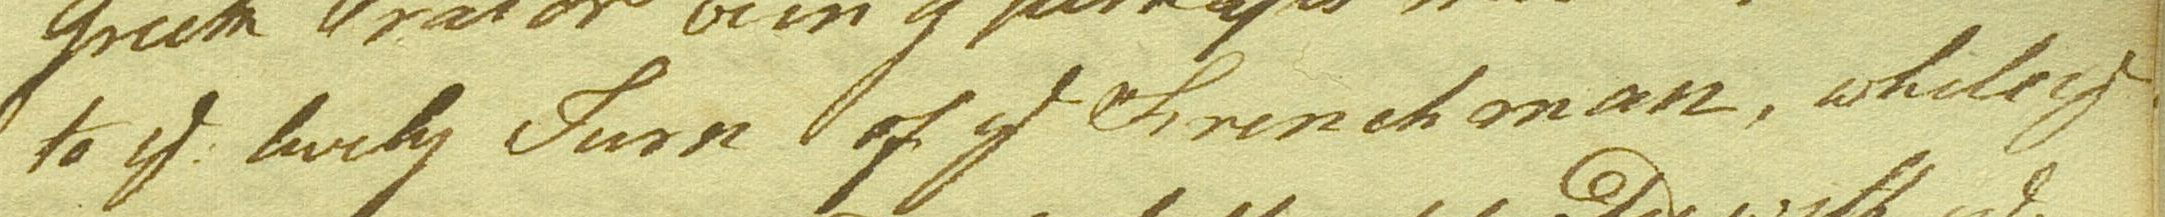to y^e: lively Turn of y^e Frenchman, while y^e
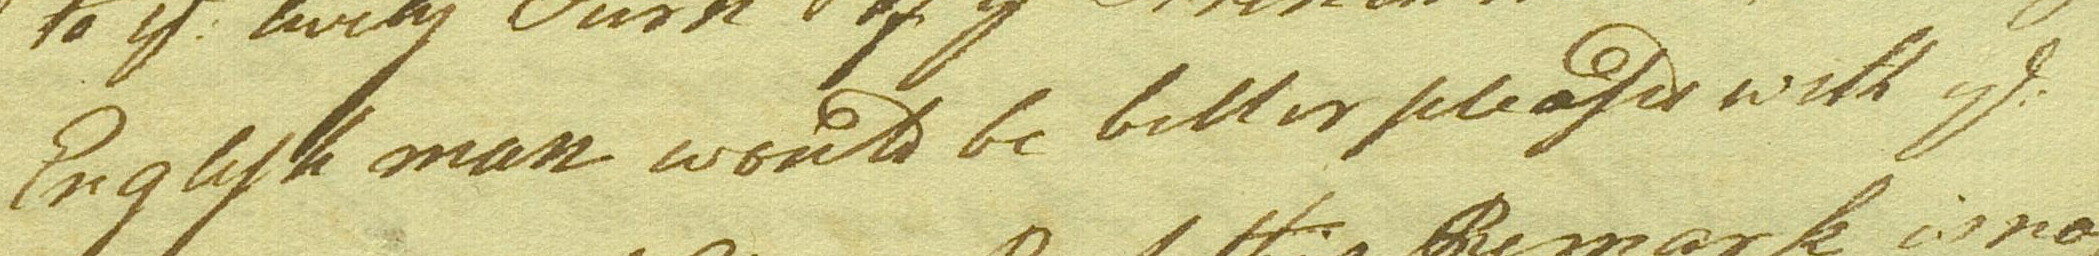Englishman would be better pleased with y^e:
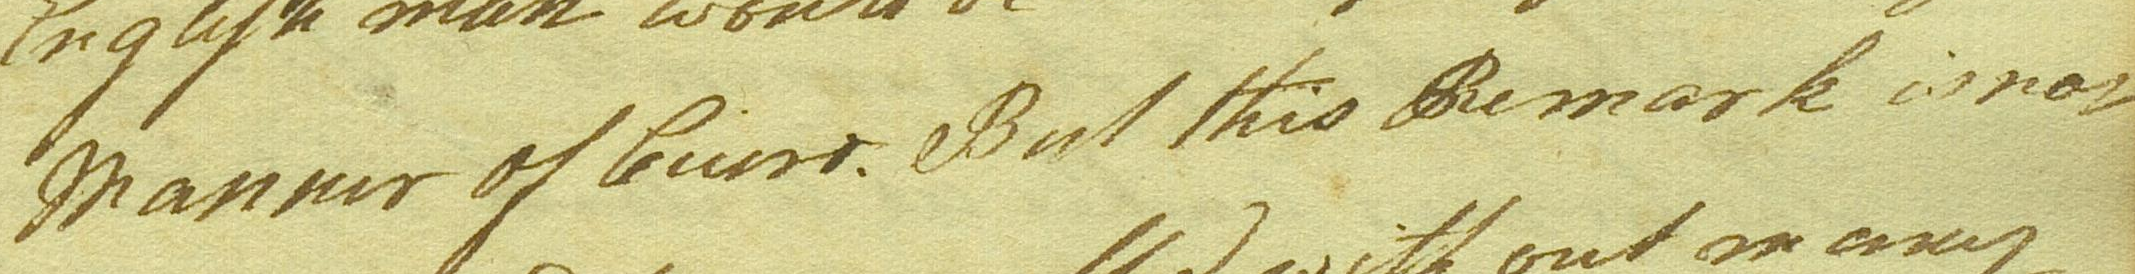Manner of Cicero. But this Remark is not
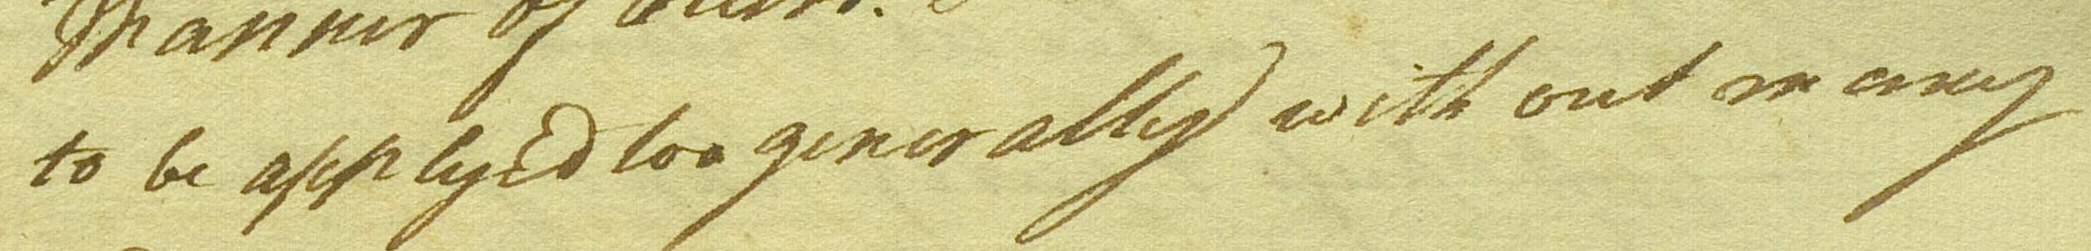to be apply'd too generally without many
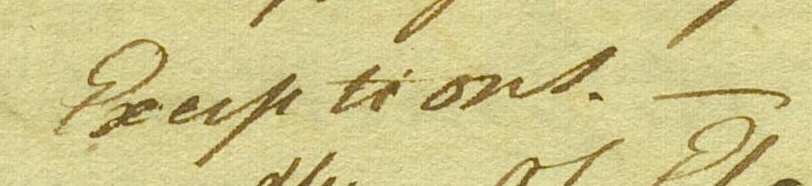Exceptions.-
